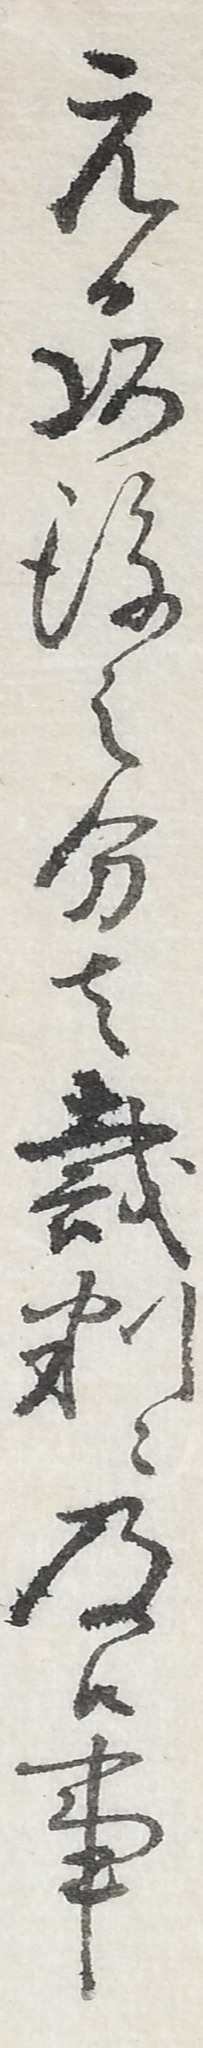元日以後之分は裁判ニ及候事
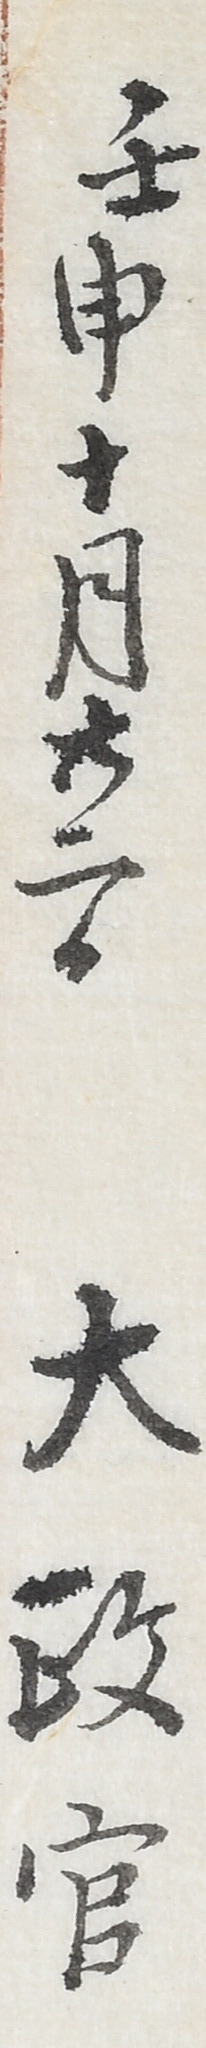壬申十月廿二日大政官
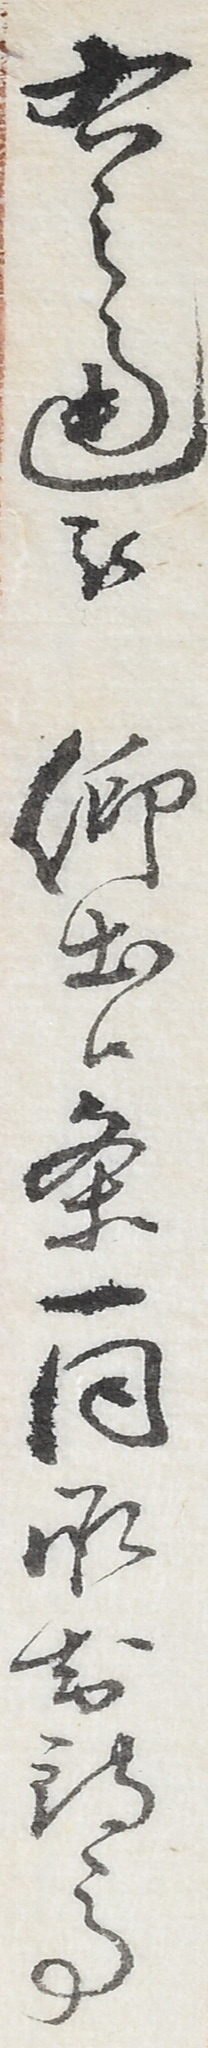右之通被仰出候条一同承知致事

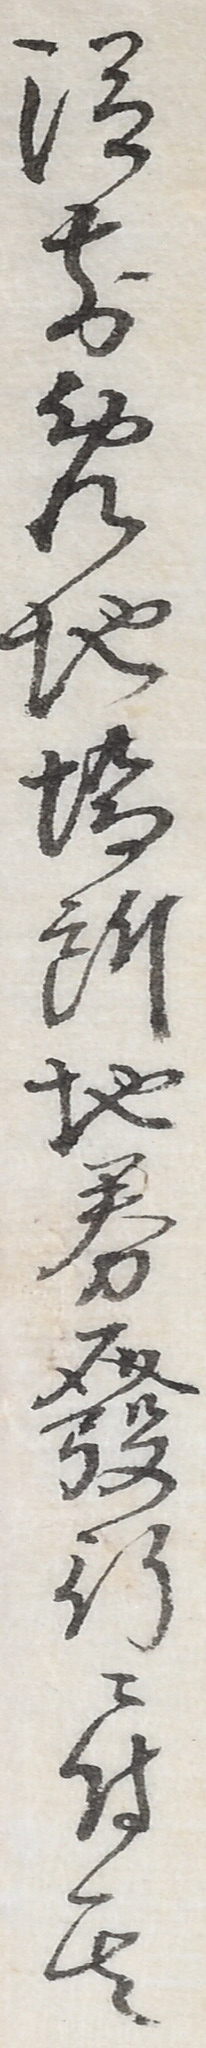従前免地場所地券発行ニ付其
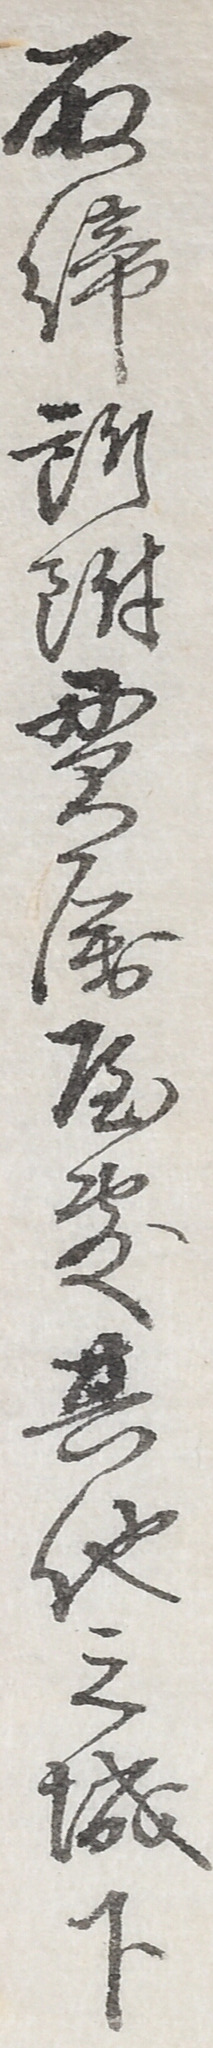取締所附貫属屋敷其他之城下
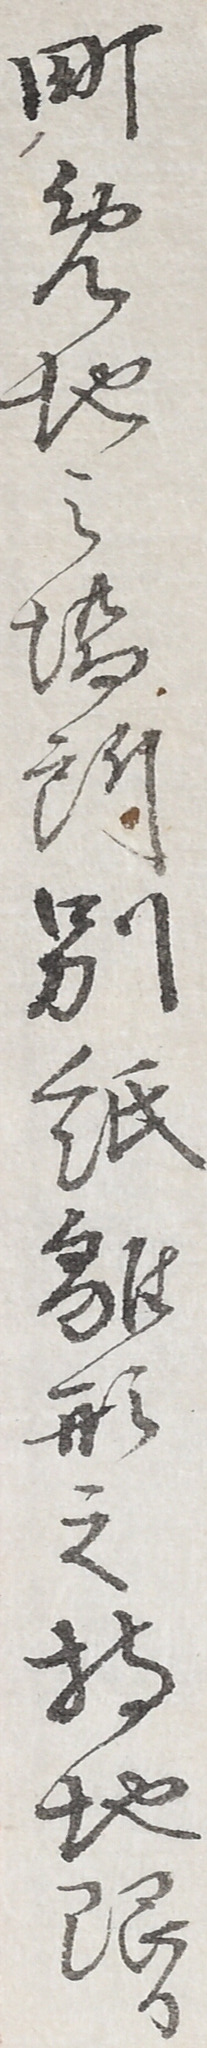町免地之場所別紙雛形之持地限り
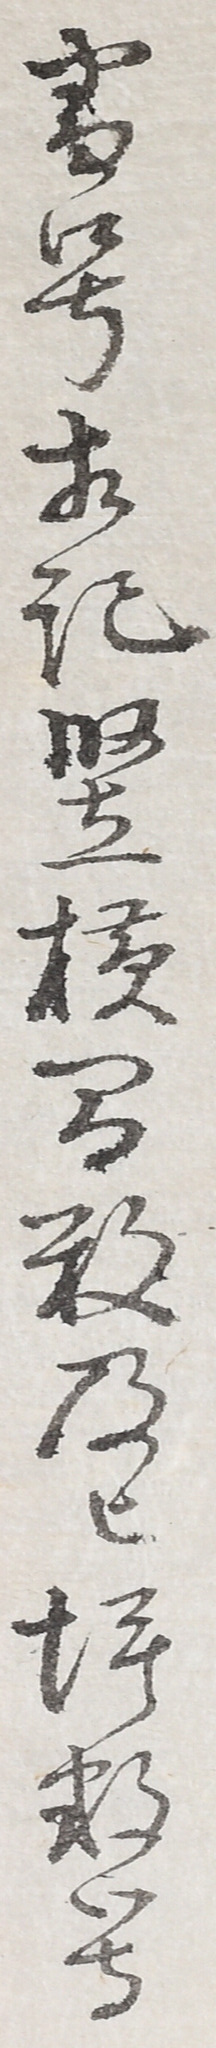番号相記竪横間数及ヒ坪数等
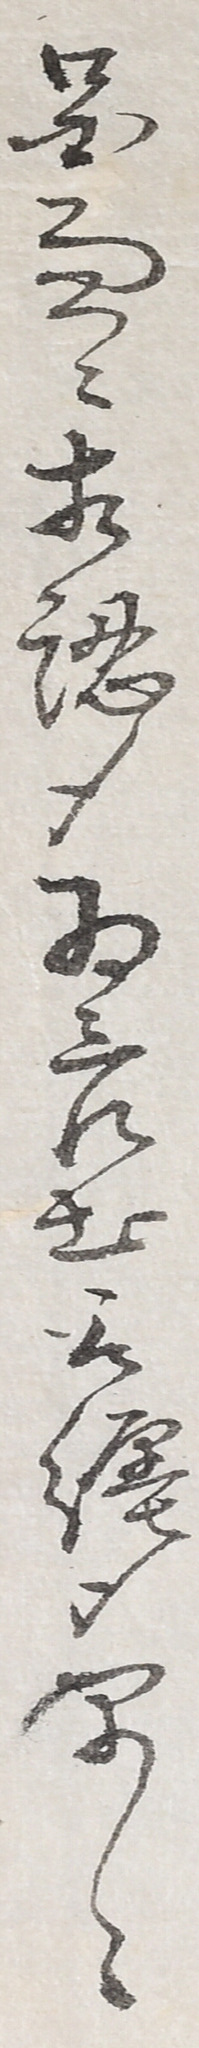図面ニ相認メ為差出取纏メ早々
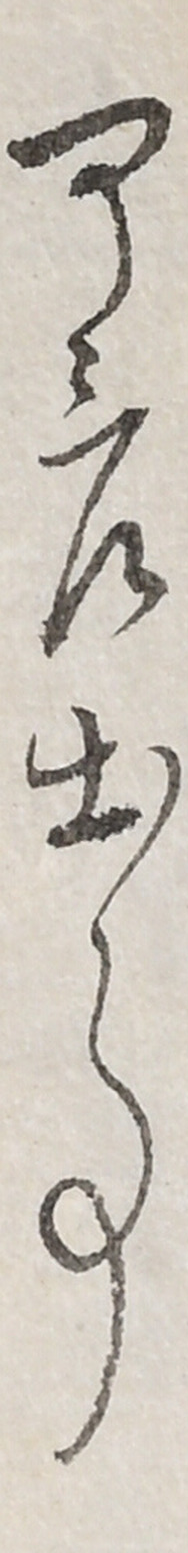可差出事
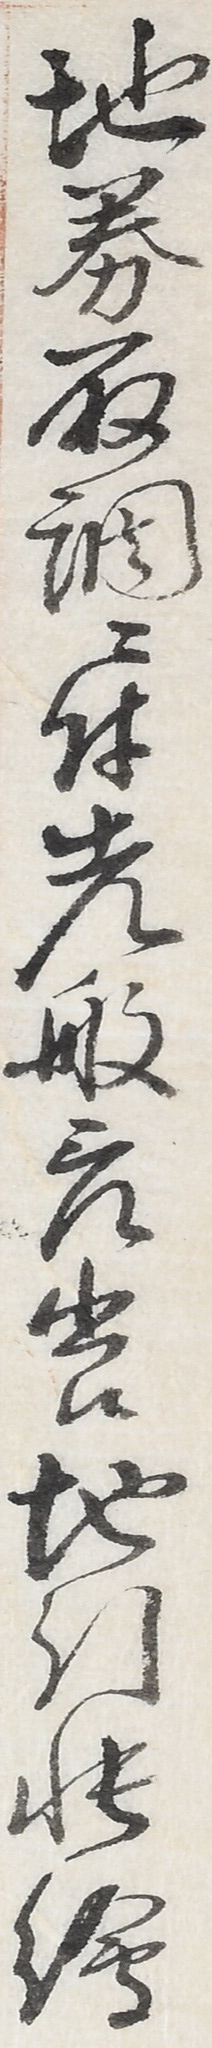地券取調ニ付先般差出候地引帳絵
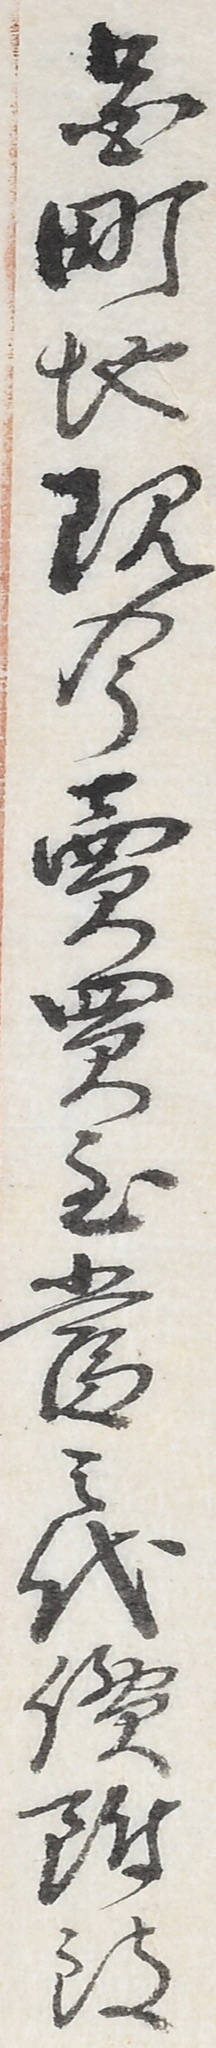図町地現今売買至当之代価附致
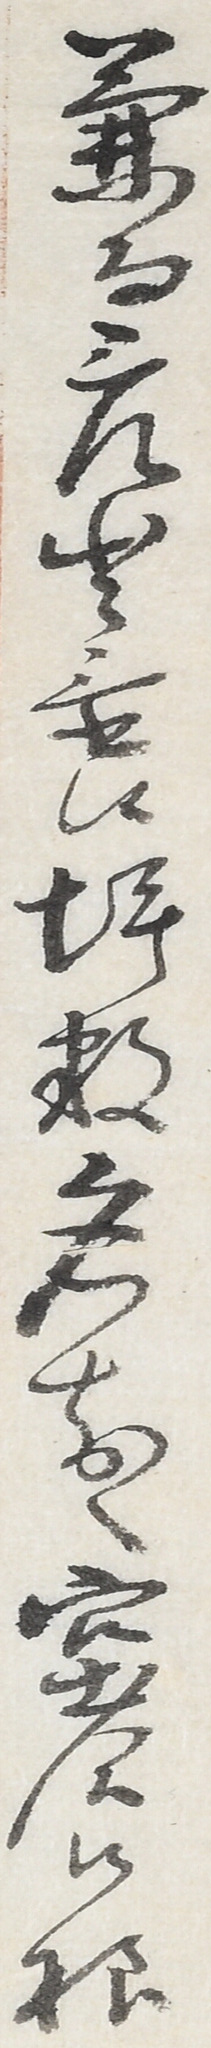兼而差出置候坪数名前へ突合候様
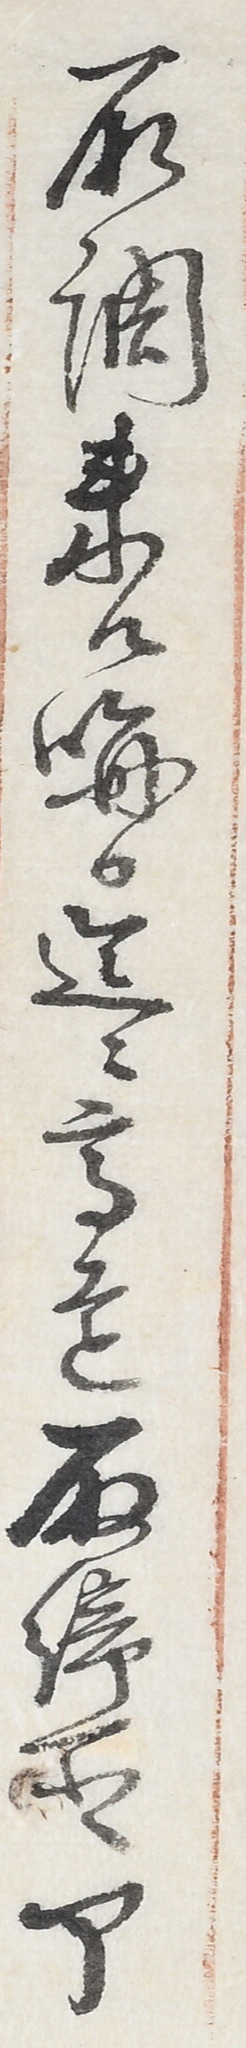取調来ル晦日迄ニ高遠取締所へ可
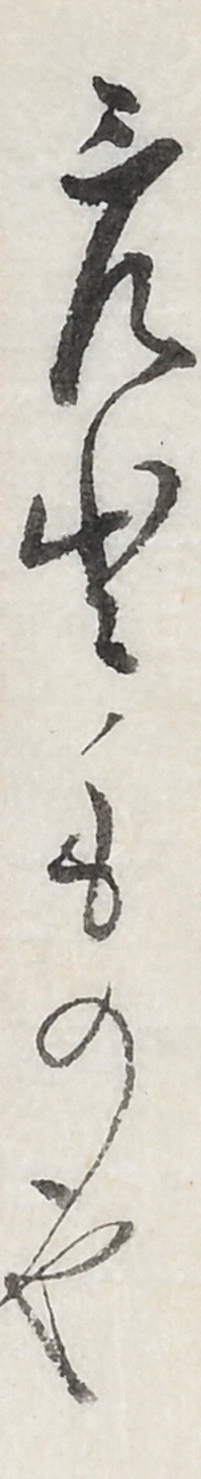差出もの也
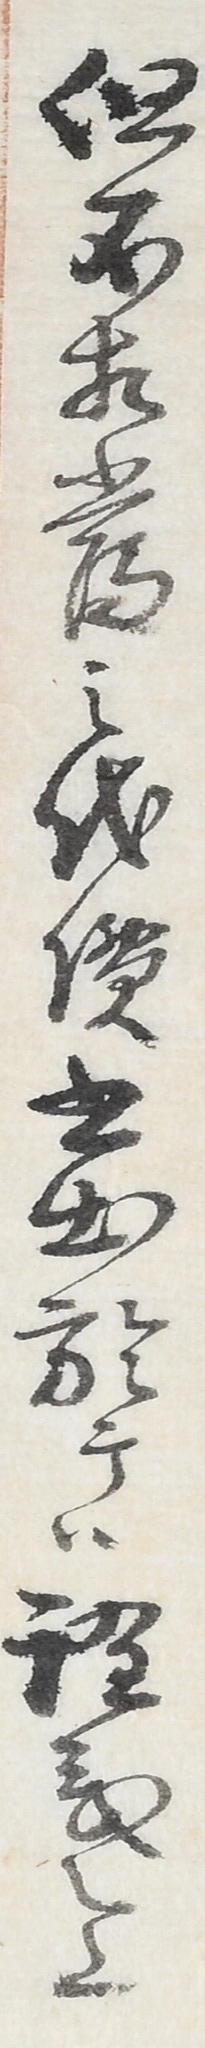但不相当之代価書出於テハ詮議之上
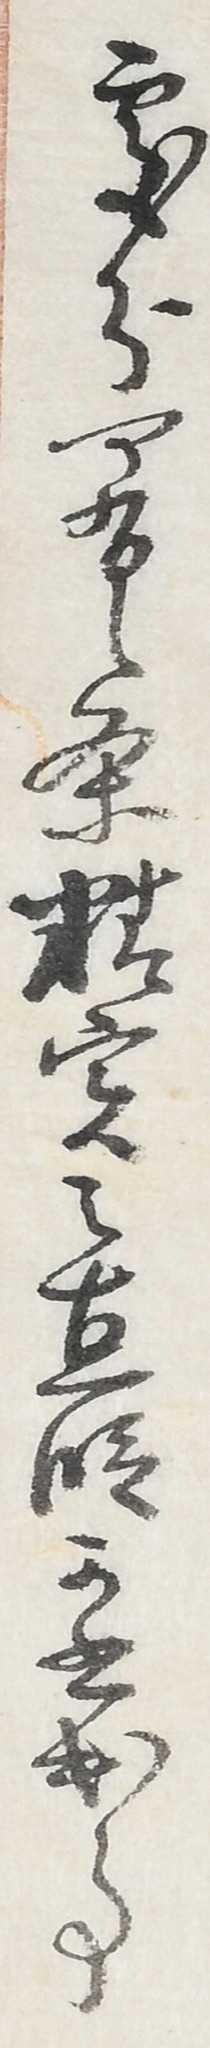処分可有之条精実之直段可書出事
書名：壹番・御布告一式
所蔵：伊那市立高遠町図書館・合同会社AMANE
